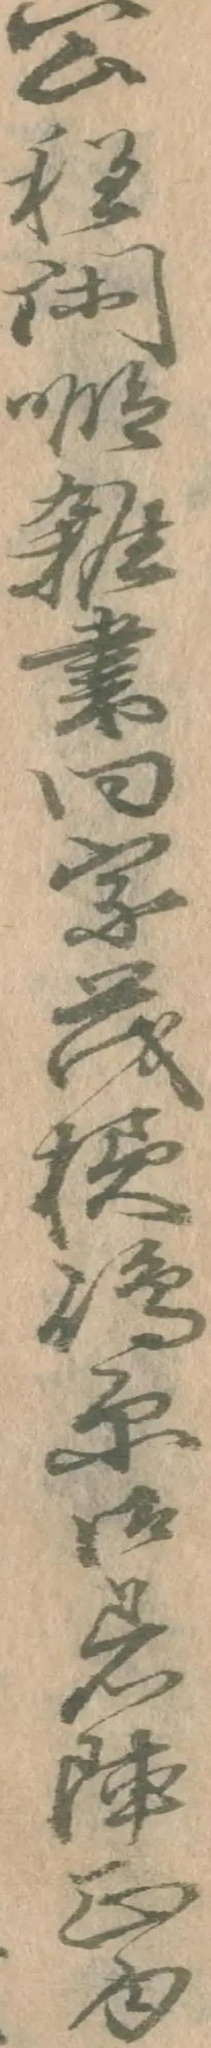公程閑暇雑書曰宗茂様島原御着陣正月
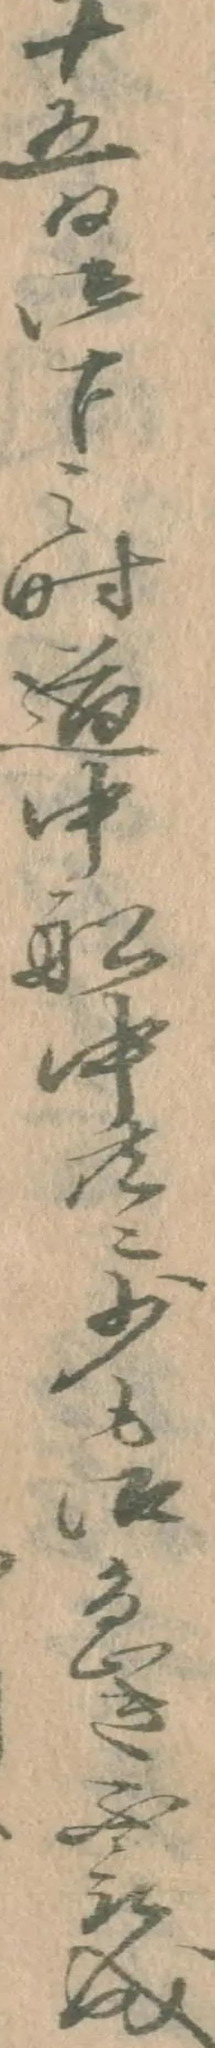十五日御下之時道中舩中共に少も御急きふ被成
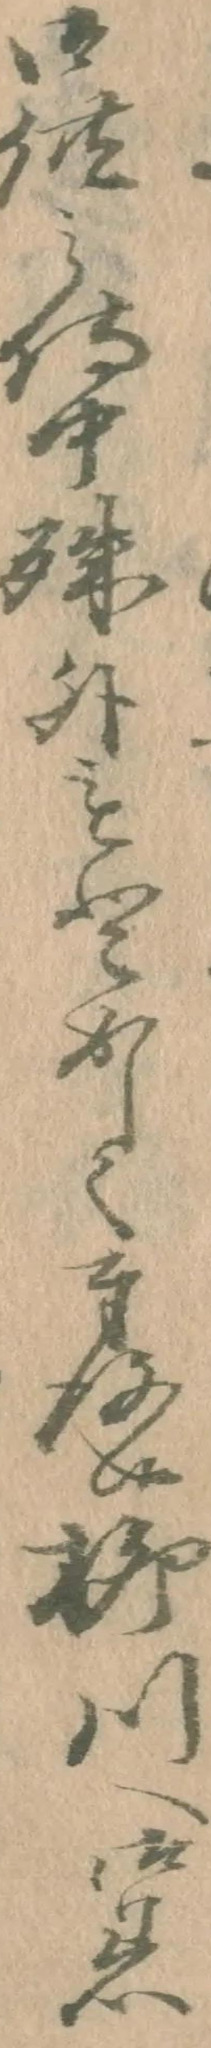御供之備中殊外も登かしく奉存候柳川へ御着
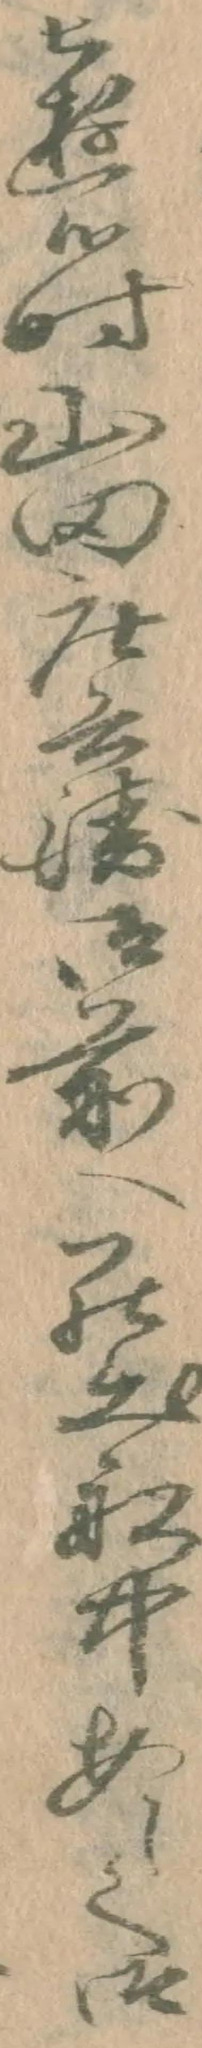被遊候時山田庄兵衛御前へ罷出舩中あしく御
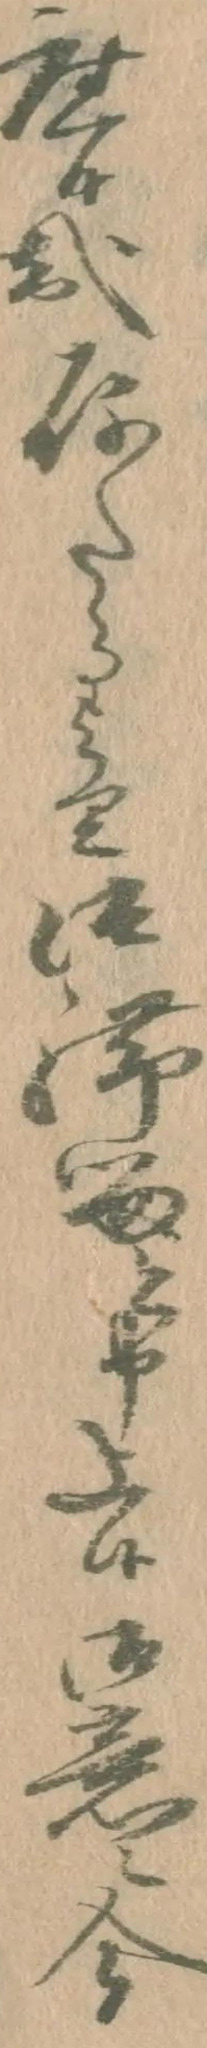座候哉存たる与里御滞留と申上候御意に今
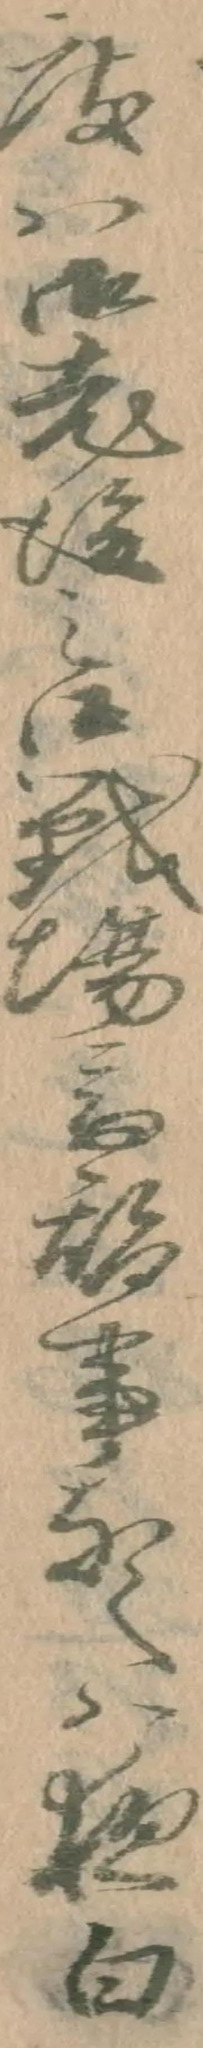度は御老後之御戦場に而替事なくは夜白
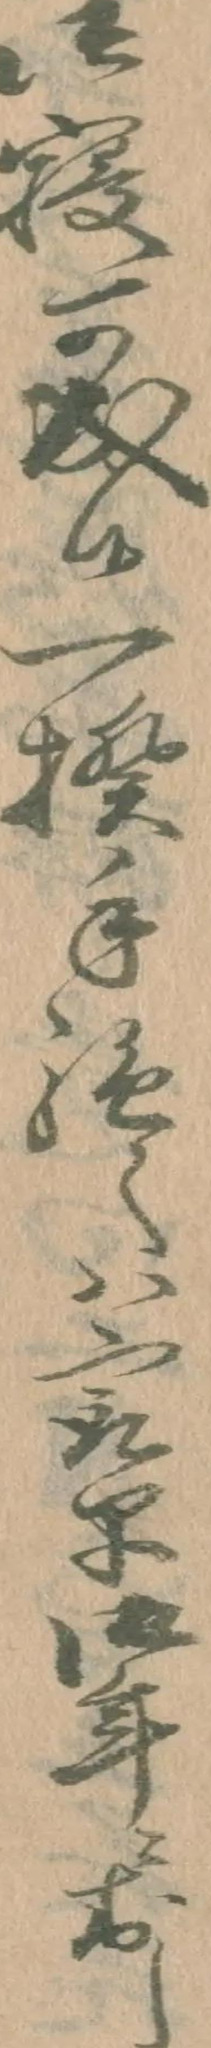御寝可成候一揆手強くは最早御年に成し
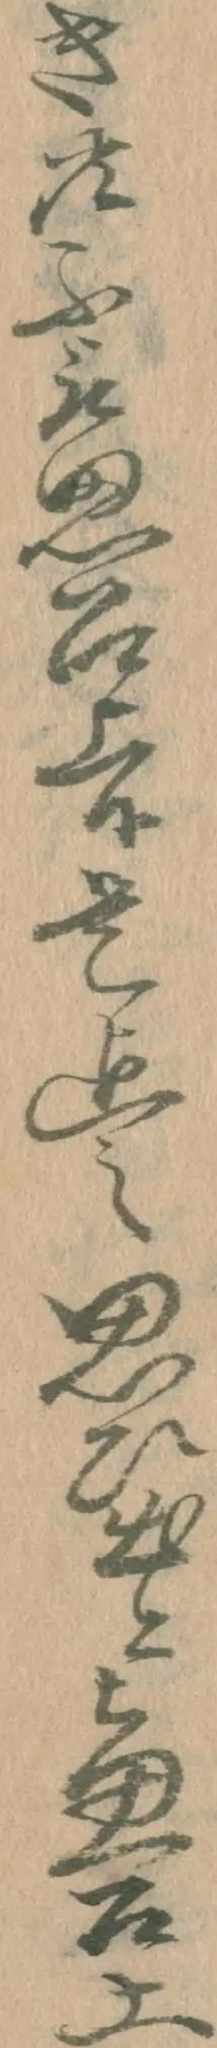き共ふ被思召上候是迄之思ひ出と被思召上
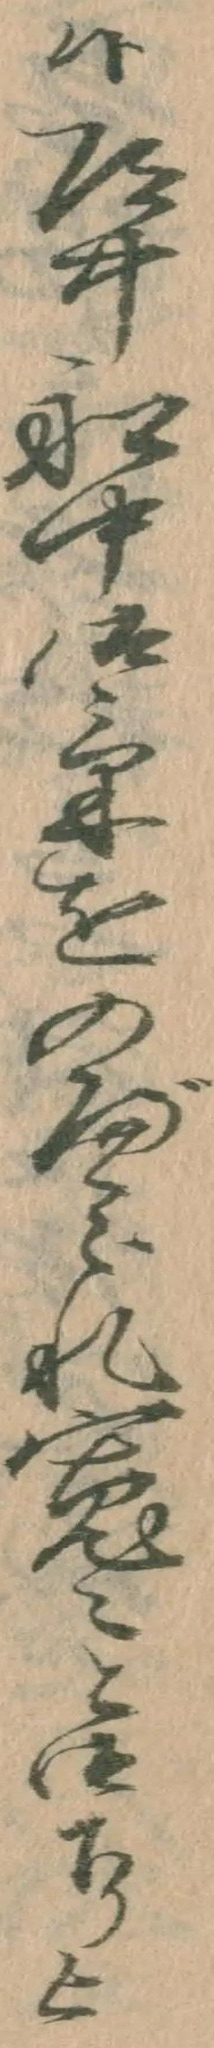候道中舩中御気をの扁られ寔々に御下りと
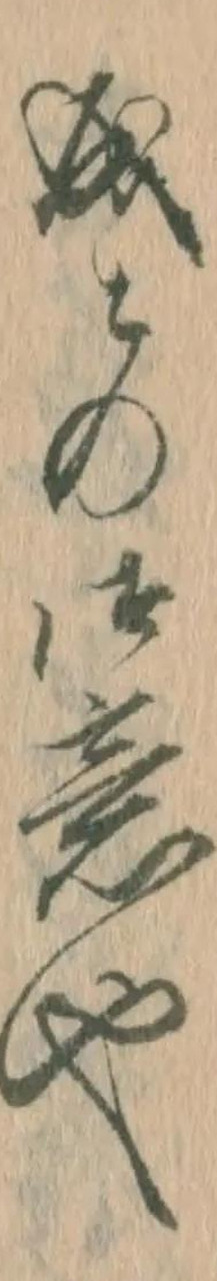成との御意也
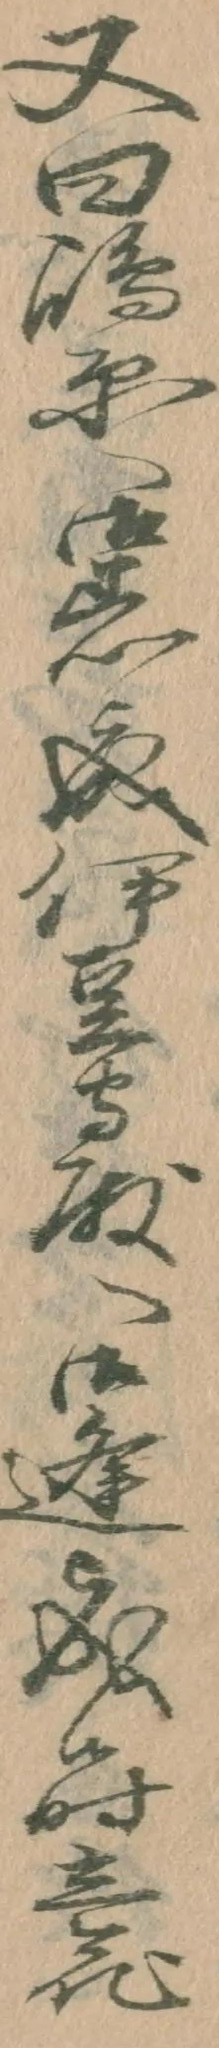又曰島原へ御着被成伊豆守殿へ御逢被成候時立花
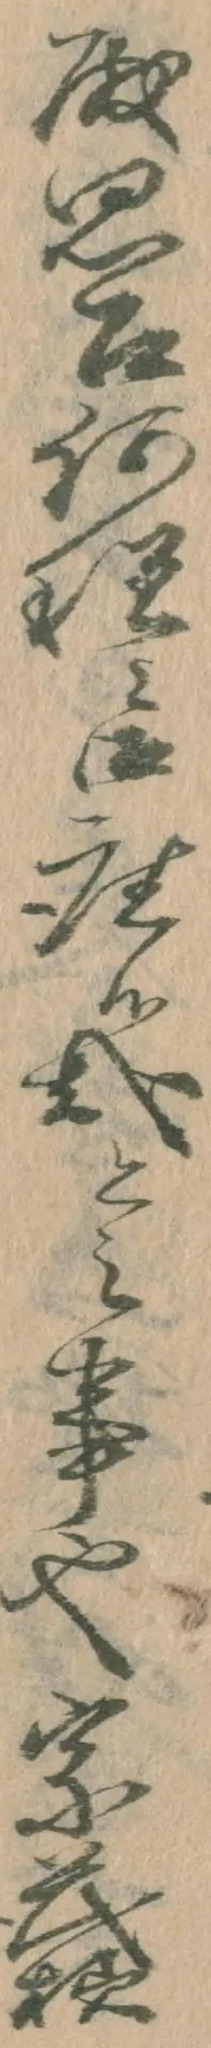殿思召何程に御座候哉と之事也宗茂様
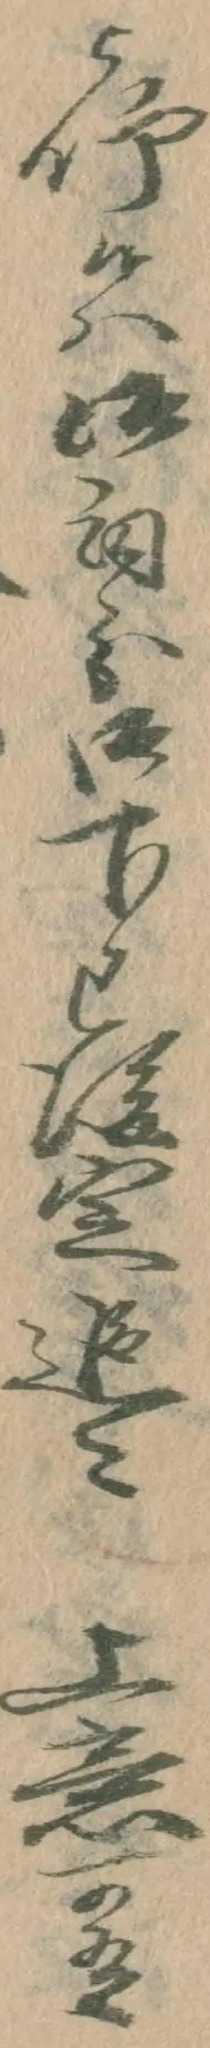被仰候は御自分御下已後定追々上意可有
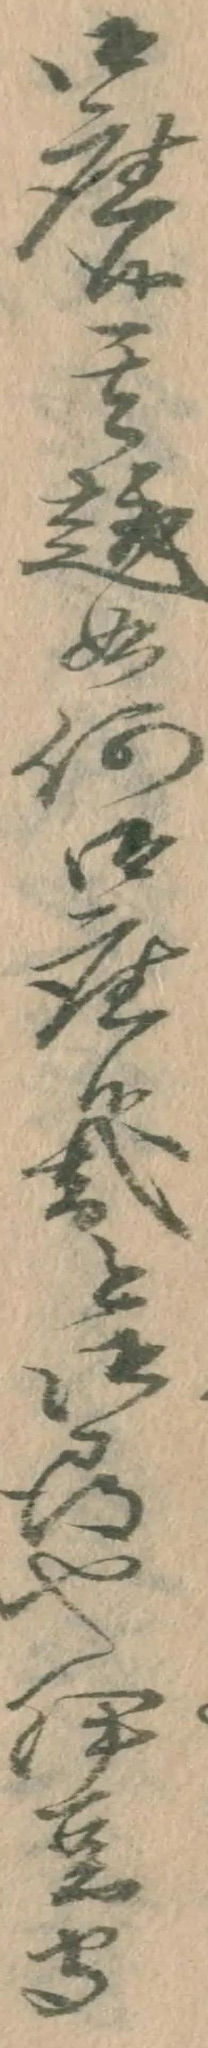御座候其趣如何御座候哉と御尋也伊豆守
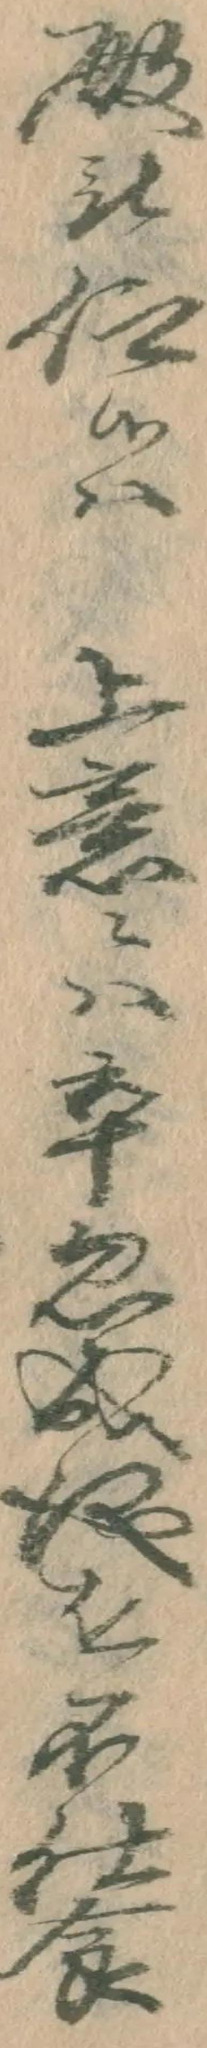殿被仰候は上意には卒忽成儀を不仕食
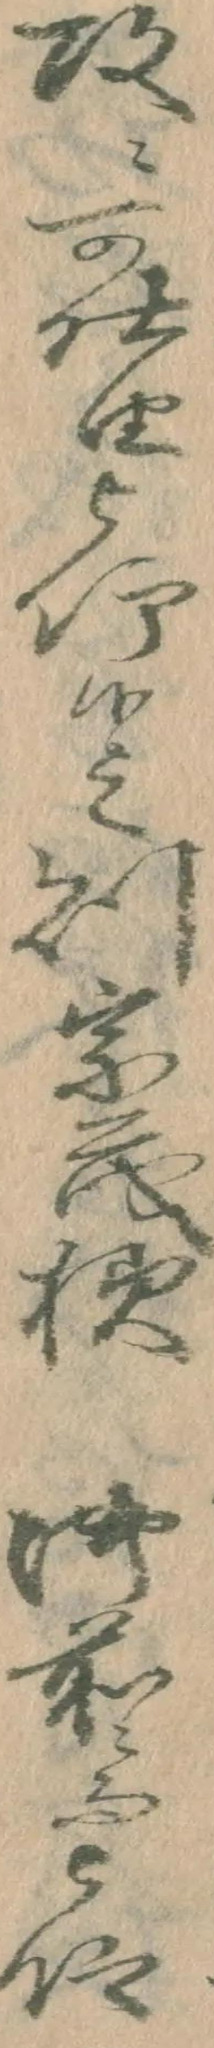攻に可仕由被仰候与則宗茂様御前に而被仰
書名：切支丹御退治記 49巻. [6]
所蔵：国立国会図書館 National Diet Library, JAPAN
